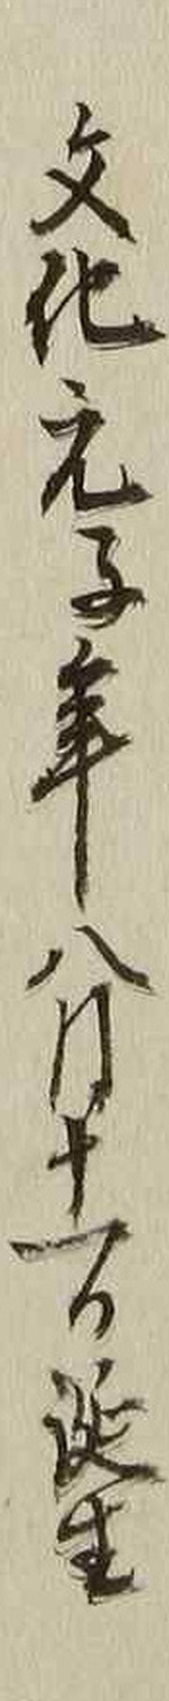文化元子年八月十一日誕生
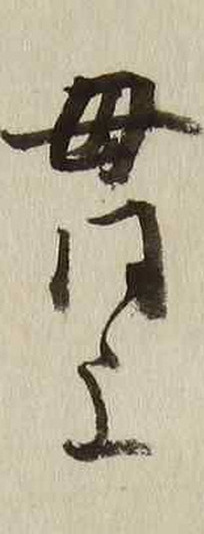母同上
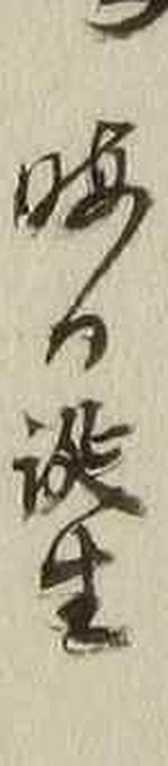晦日誕生
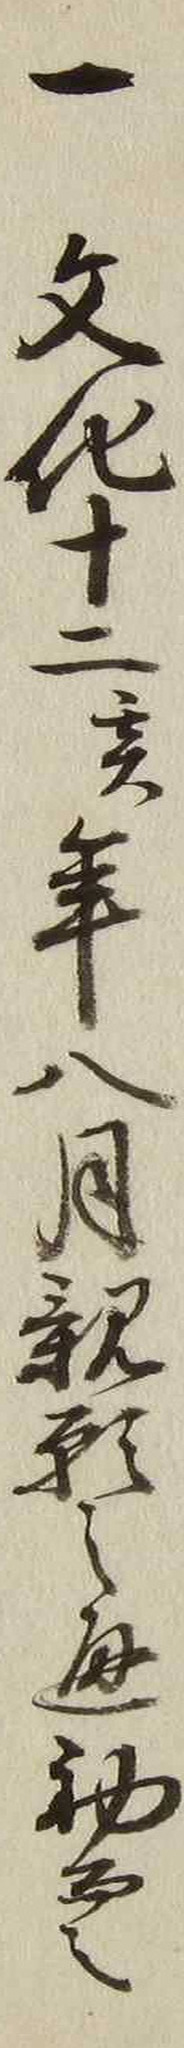一文化十二亥年八月親願之通初而之
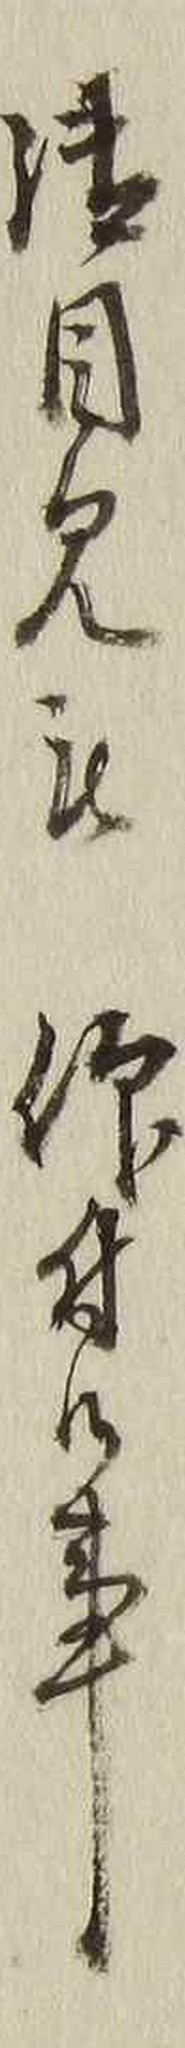御目見被仰付候事
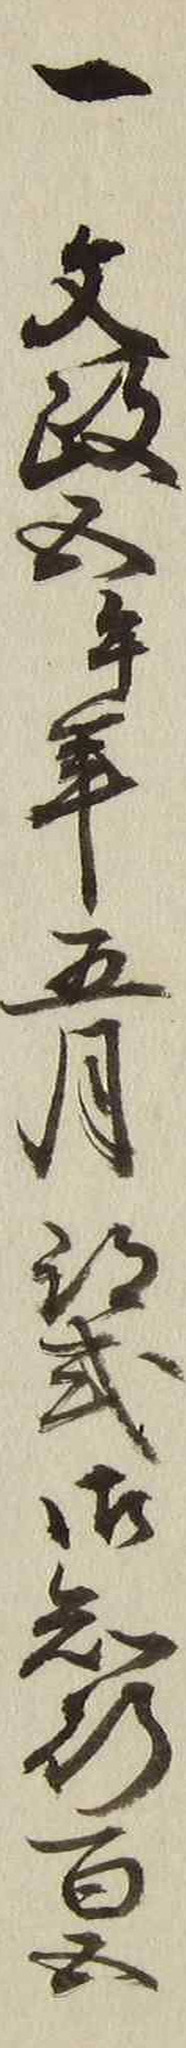一文政五午年五月跡式御知行百五
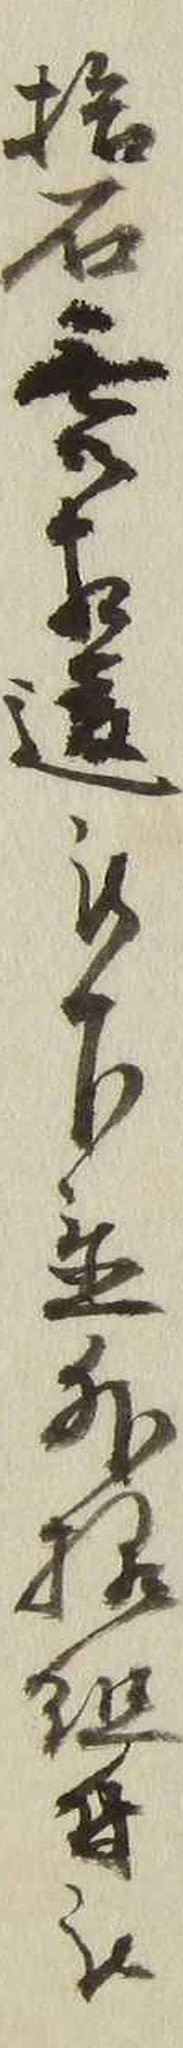拾石無御相違被下置外様組付被
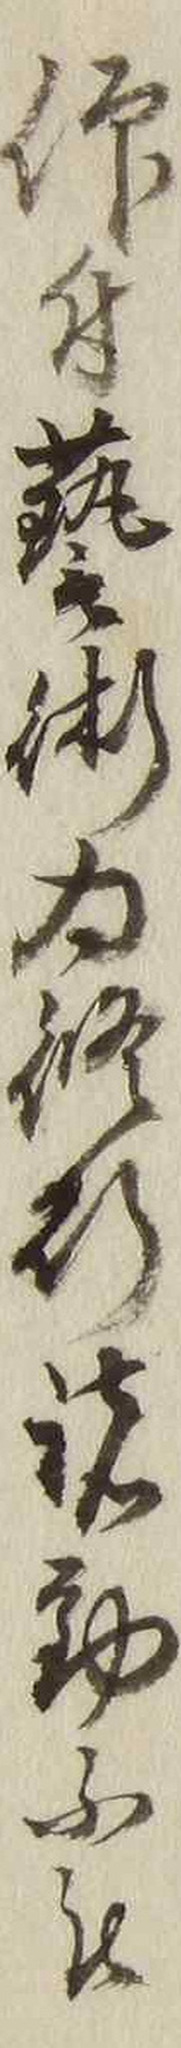仰付芸術為修行諸勤不被
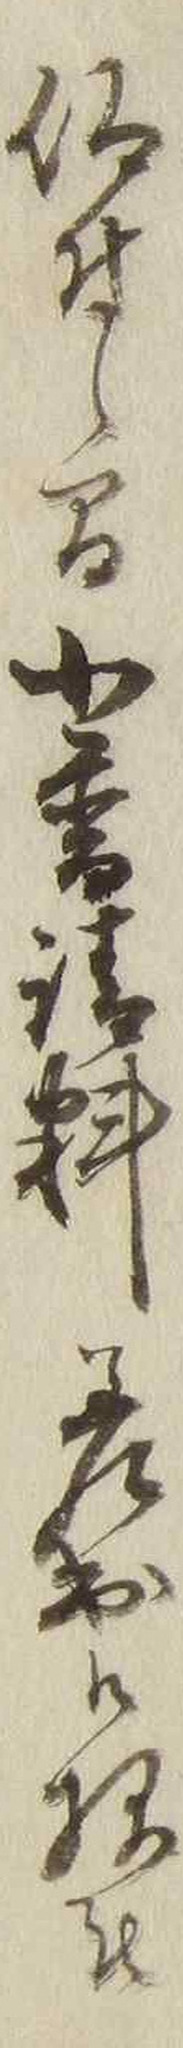仰付候間小普請料差出候様被

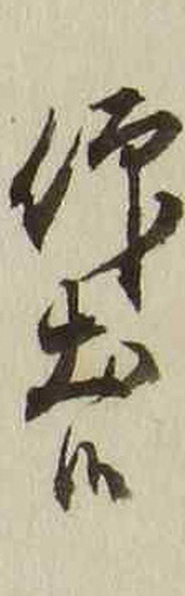仰出候
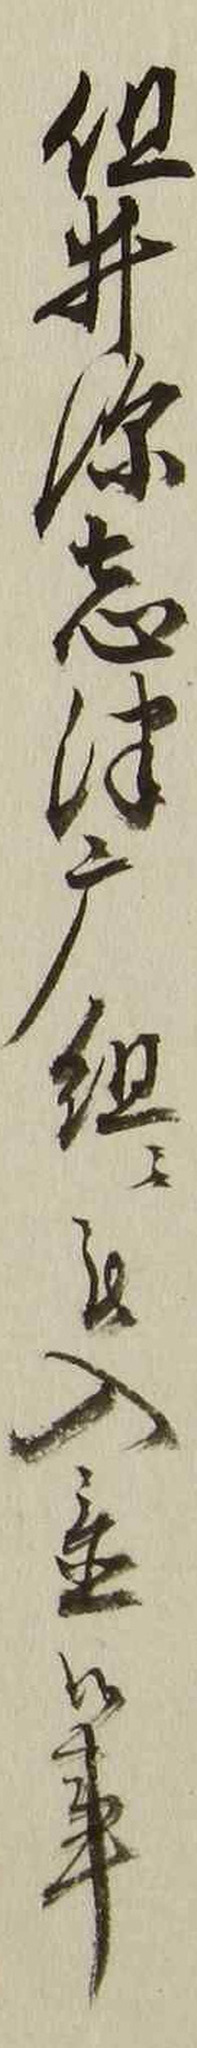但井深志津磨組ニ被入置候事
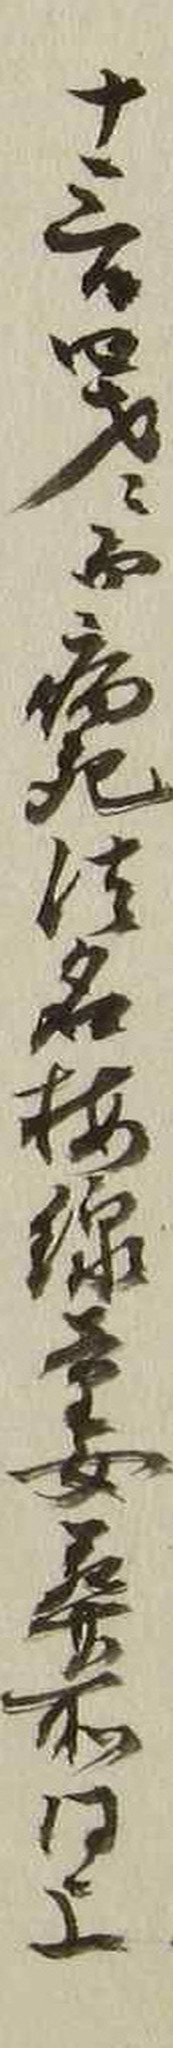十三日四才ニ而病死法名梅線童女葬所同上
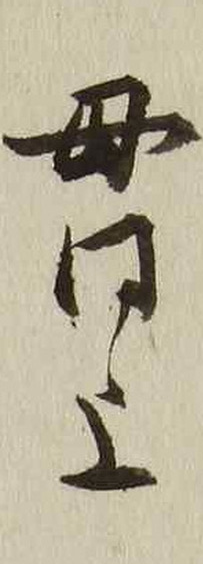母同上
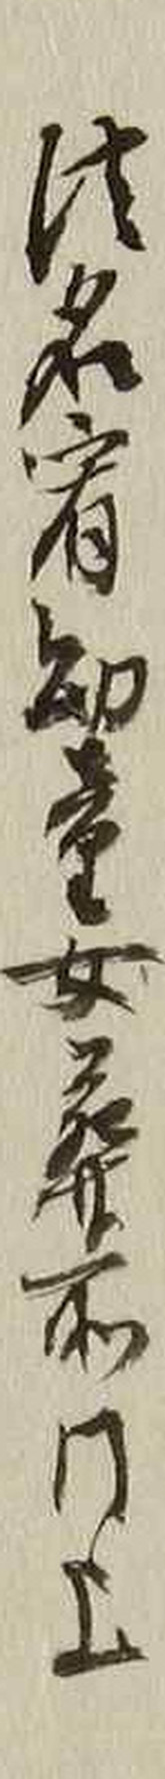法名宥幼童女葬所同上
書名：諸士系譜　巻之23　い之部23
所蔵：会津若松市立会津図書館
